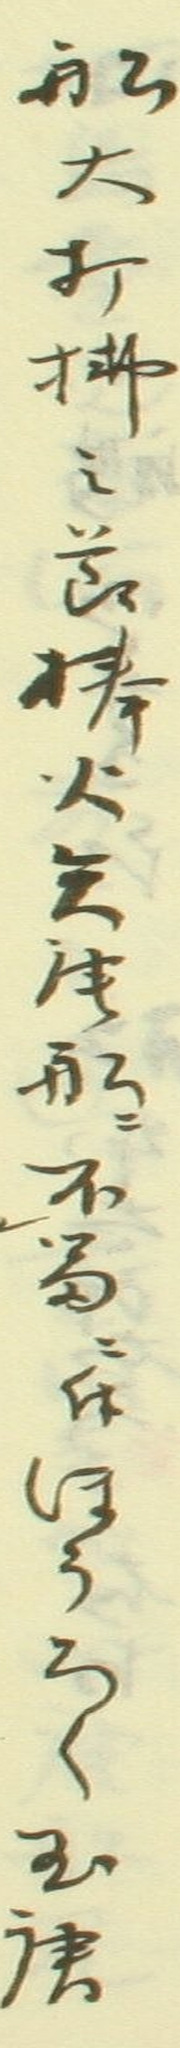船大打払之節棒火矢唐船に不当に付ほうろく玉唐
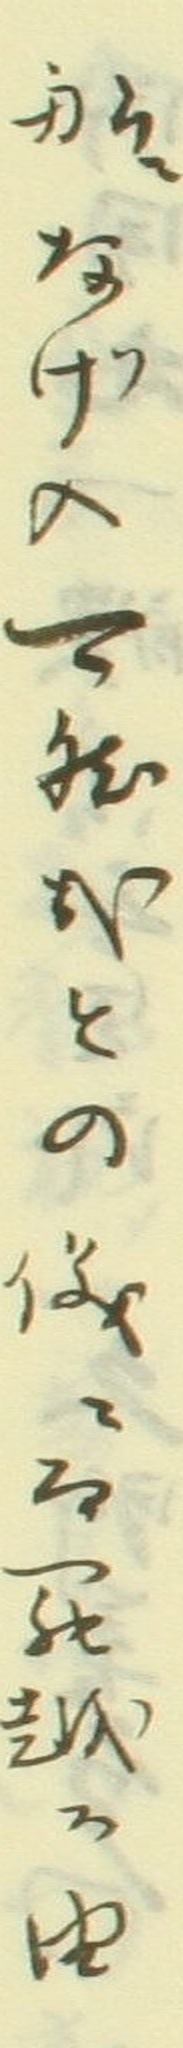船になげ入可然哉との儀に而罷越而由

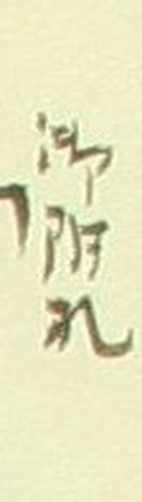御附札
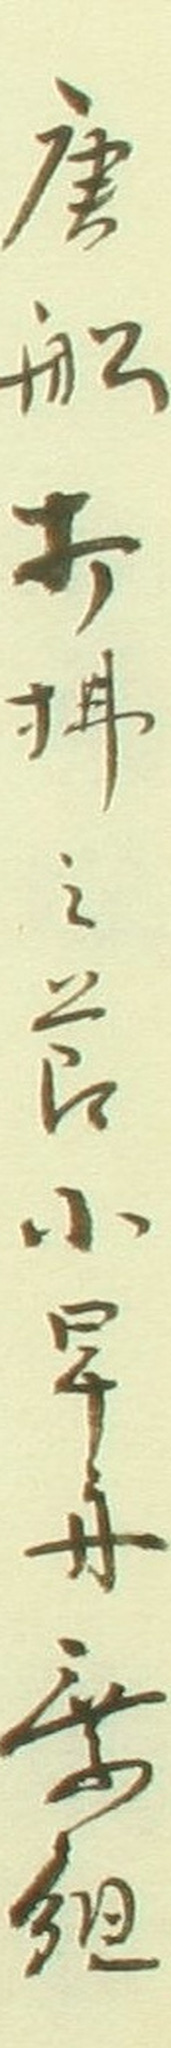唐船打払之節小早舟乗組
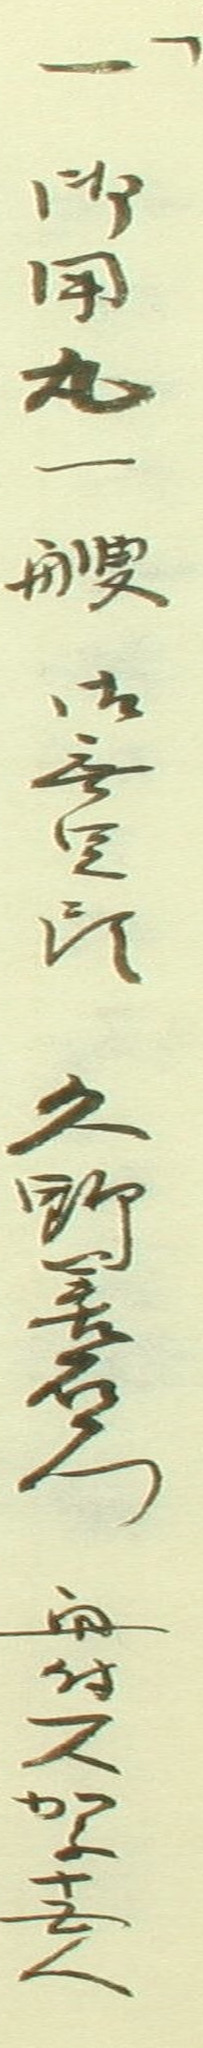一御用丸一艘御？足頭久野善右衛門舟付一人水主十五人
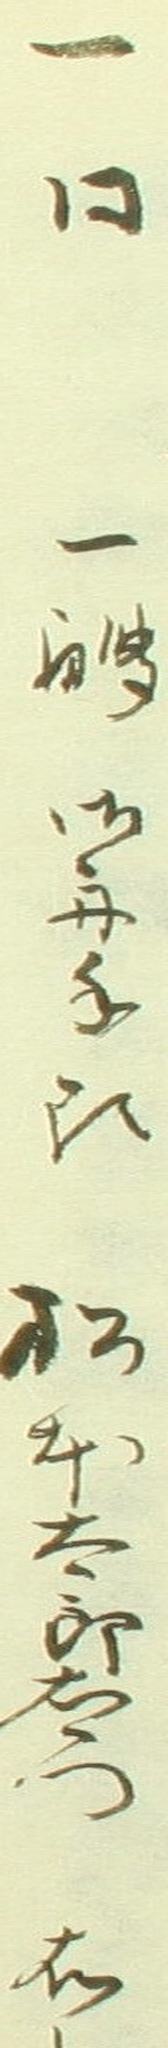一同一艘御舟手頭松平太郎右衛門右同断
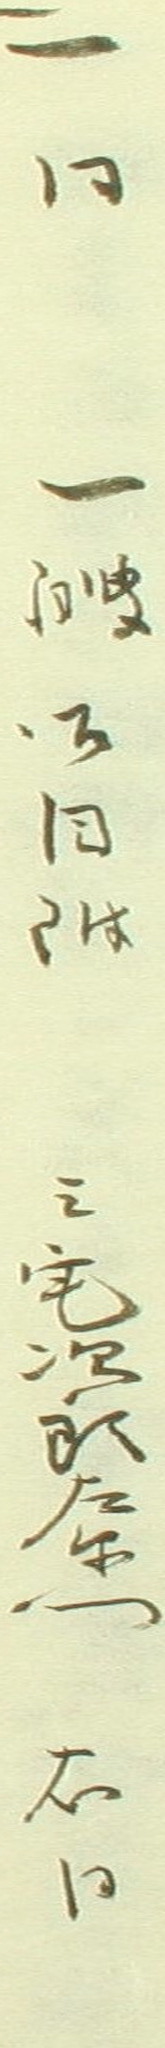一同一艘御目附三宅次朗右衛門右同断
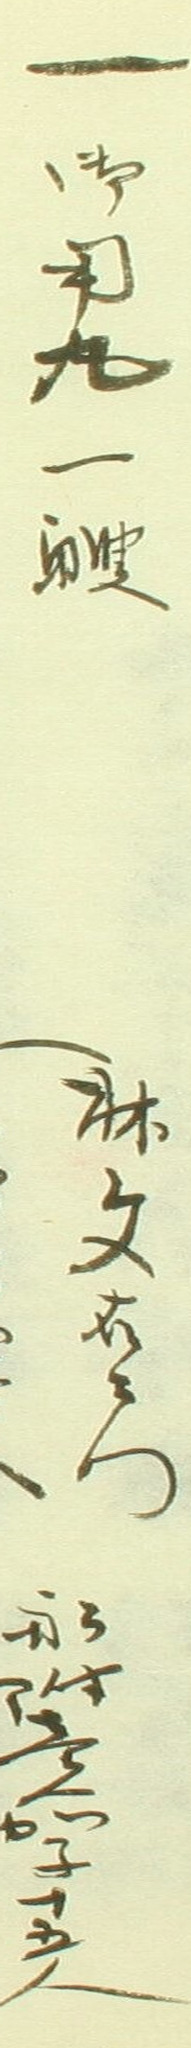一御用丸一艘林文右衛門船附壱人水主十五人
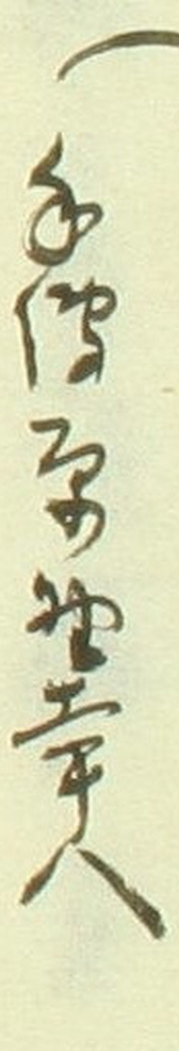手伝原野幸八
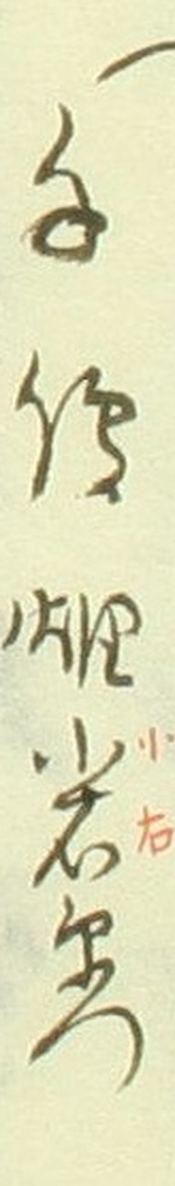手伝畑小右衛門
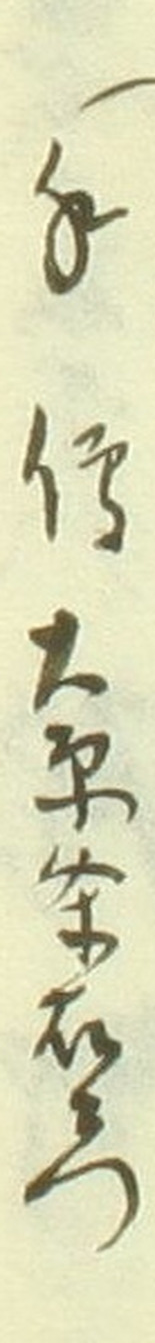手伝大原条右衛門
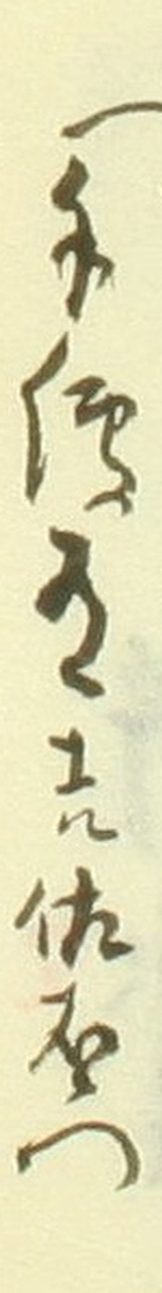手伝有吉吉佐右衛門
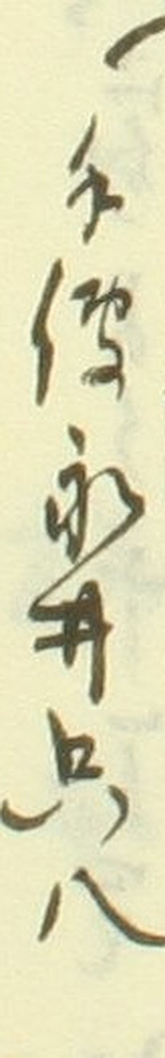手伝永井只八
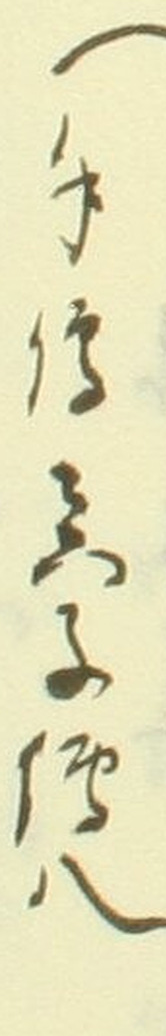手伝真子伝八
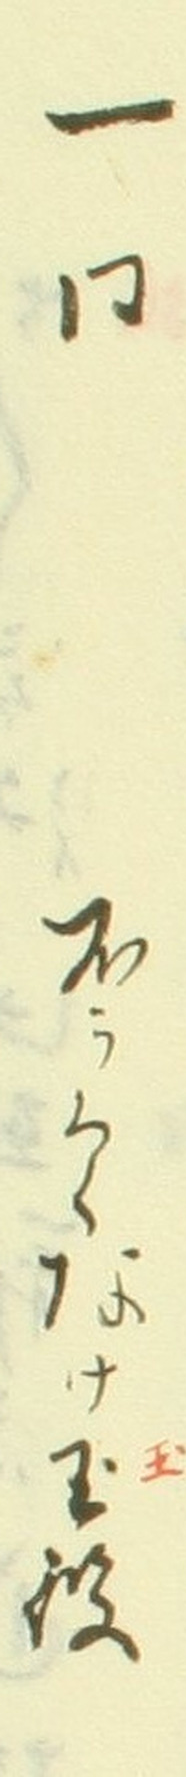一同不うろく阿十玉役
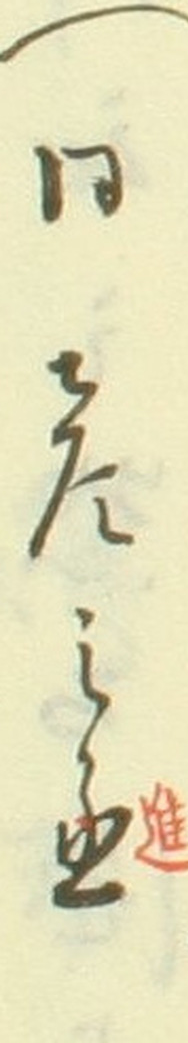同彦之丞
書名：唐船漂流記 三
